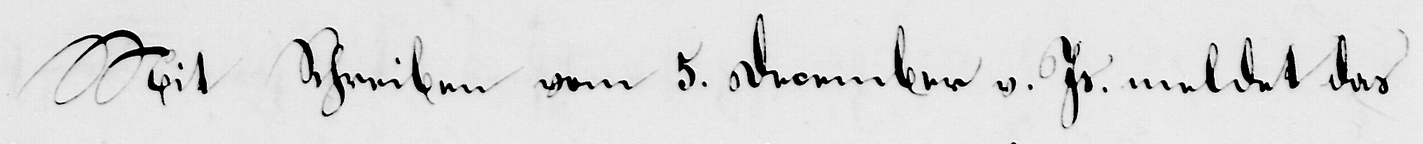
Mit Schreiben vom 5. December v. Js. meldet das
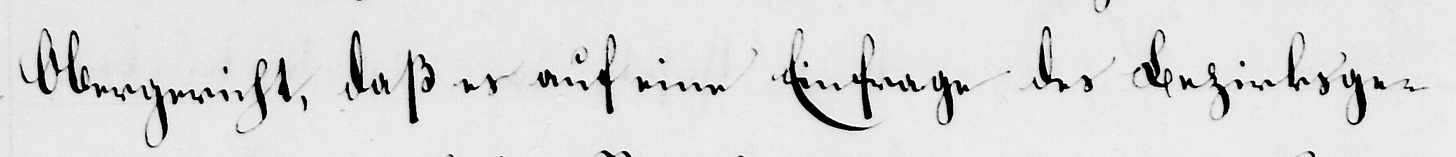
Obergericht, daß es auf eine Einfrage des Bezirksge¬
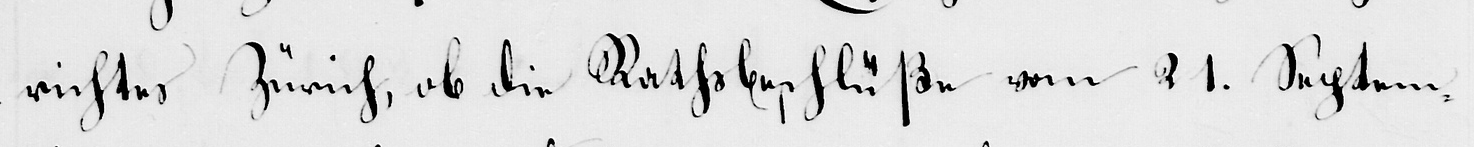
richtes Zürich, ob die Rathsbeschlüße vom 21. Septem¬
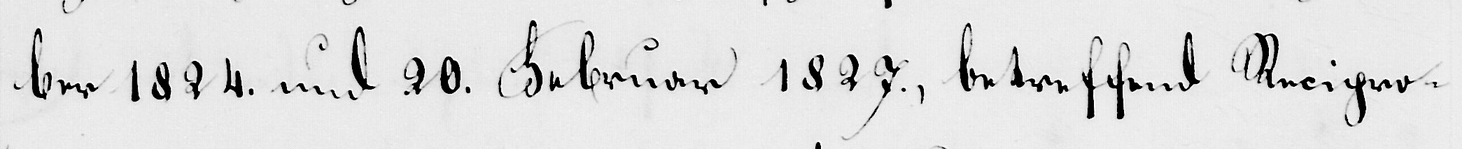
ber 1824 und 20. Februar 1827., betreffend Recipro¬
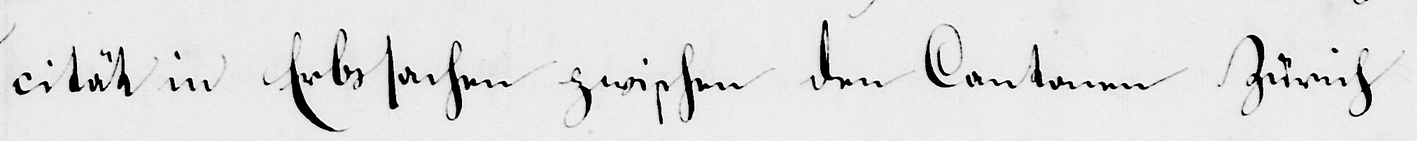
cität in Erbssachen zwischen den Cantonen Zürich
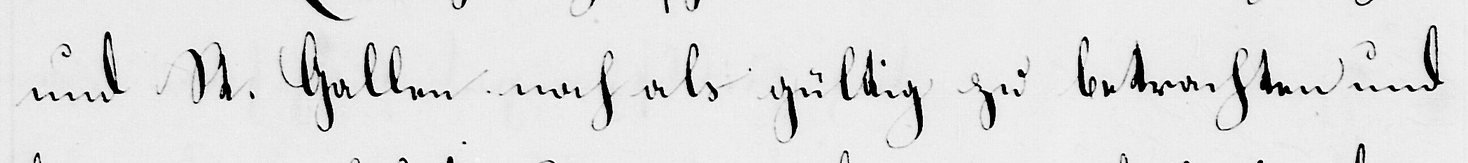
und St. Gallen auf als gültig zu betrachten und
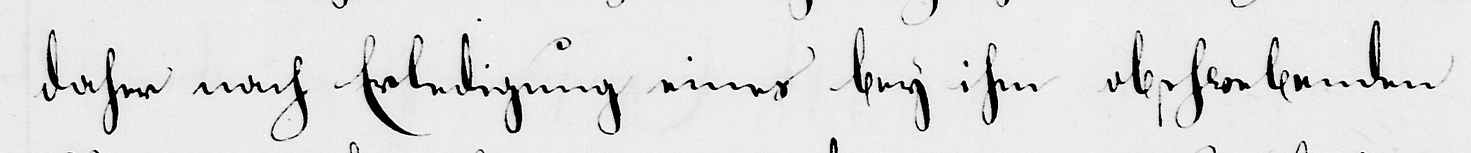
daher nach Erledigung eines bey ihm obschwebenden
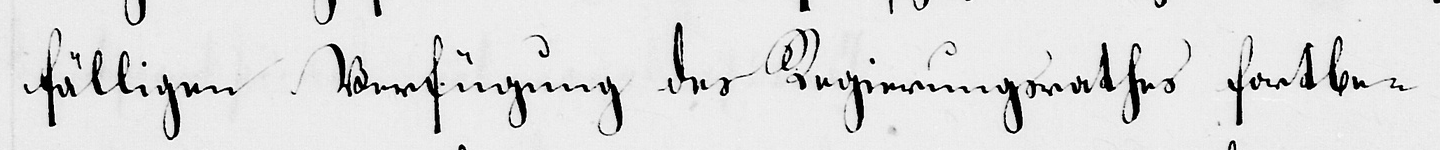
fälligen Verfügung des Regierungsrathes fortbe¬
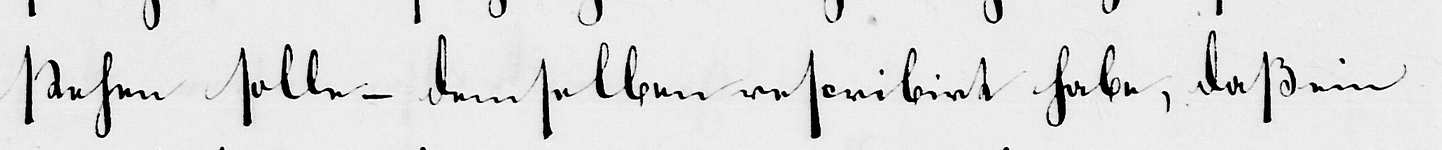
stehen solle – demselben rescribirt habe, daß ein
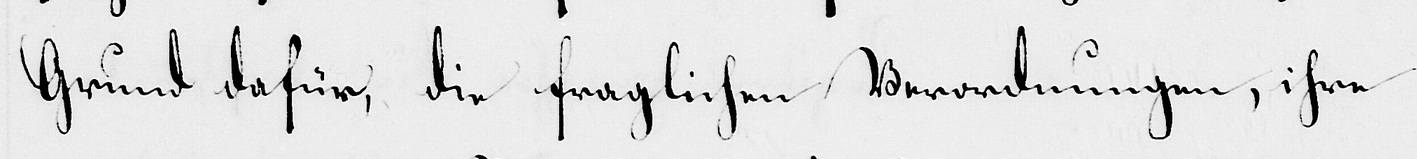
Grund dafür, die fraglichen Verordnungen, ihre
